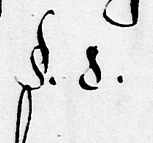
§. 8.
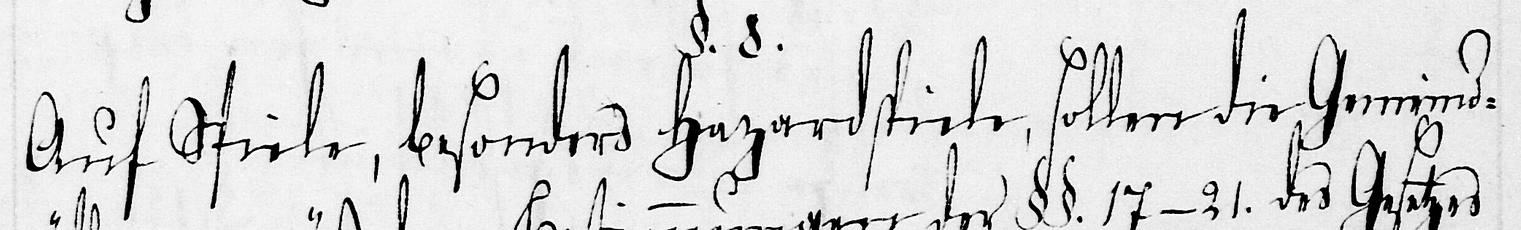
Auf Spiele, besonders Hazardspiele, sollen die Gemeind¬
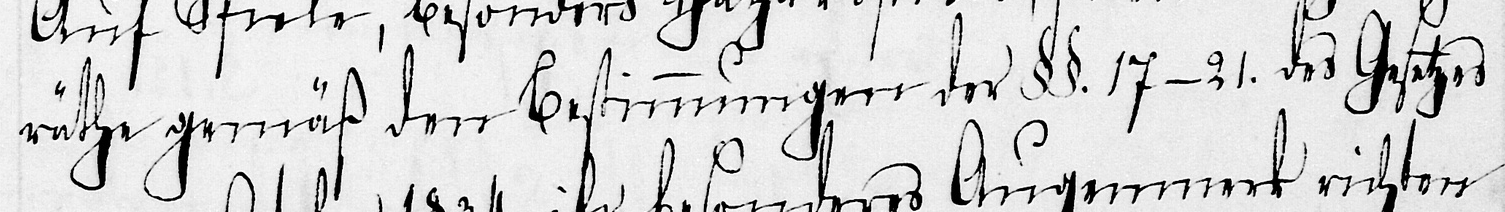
räthe gemäß den Bestimmungen der §§. 17–21. des Gesetzes
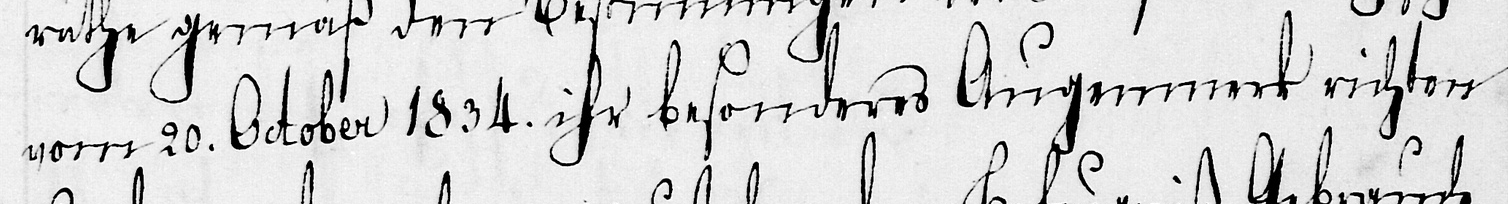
vom 20. October 1834. ihr besonderes Augenmerk richten
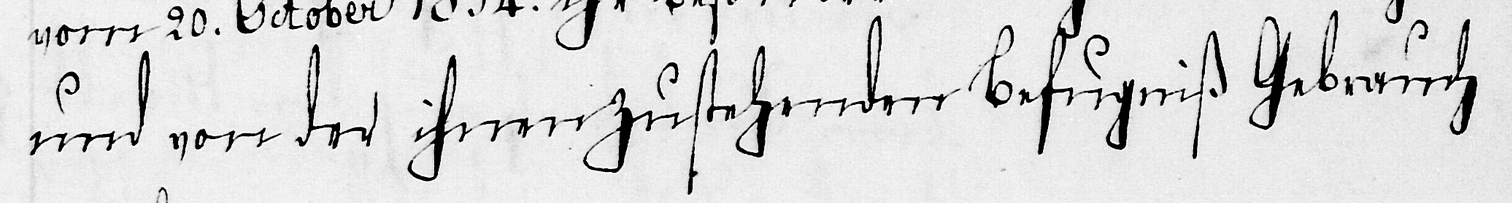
und von der ihnen zustehenden Befugniß Gebrauch
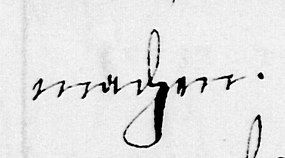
machen.
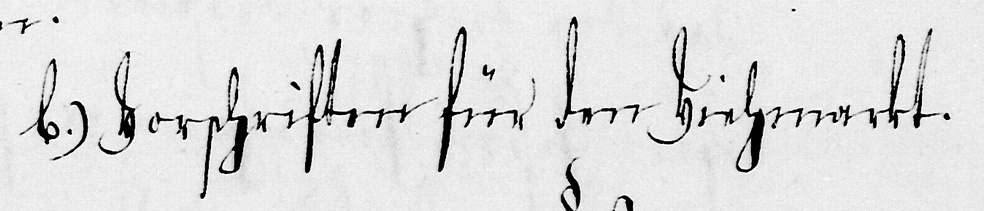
b.) Vorschriften für den Viehmarkt.
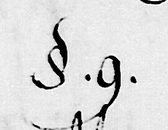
§.9.
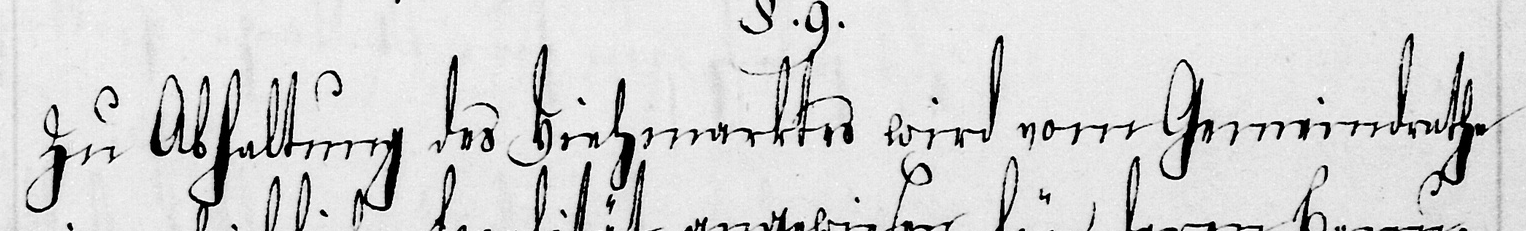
Zu Abhaltung des Viehmarktes wird vom Gemeindrathe
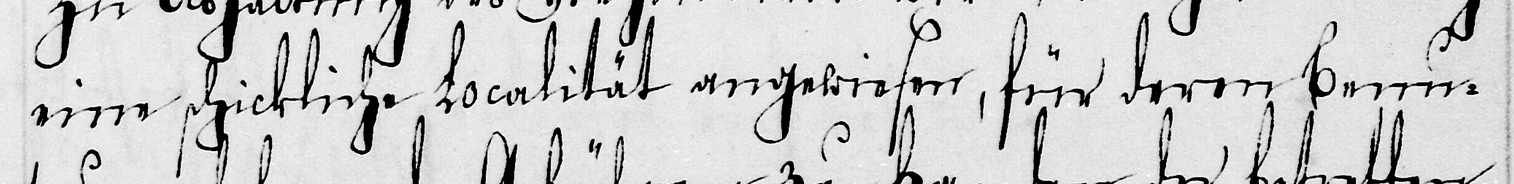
eine schickliche Localität angewiesen, für deren Benu¬
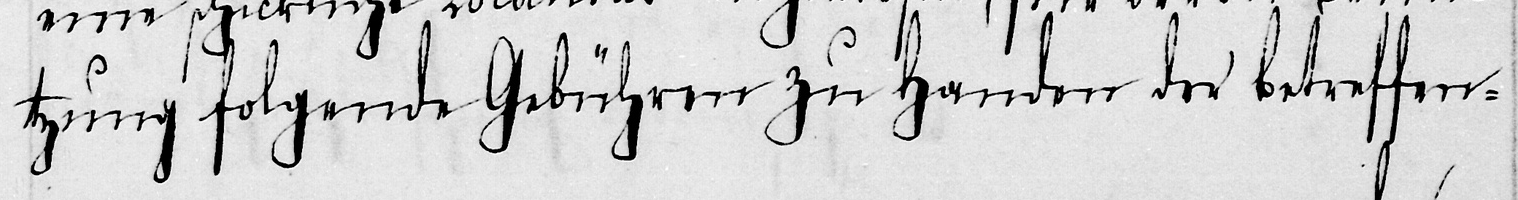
tzung folgende Gebühren zu Handen der betreffen-
